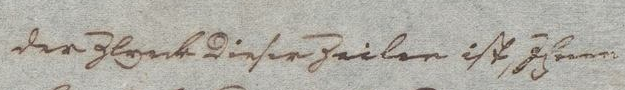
Der Zweck dieser Zeilen ist, Ihnen
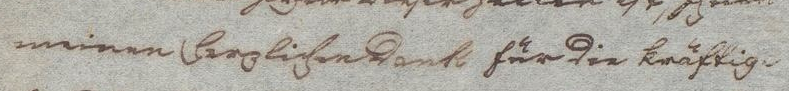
meinen herzlichen Dank für die kräftige
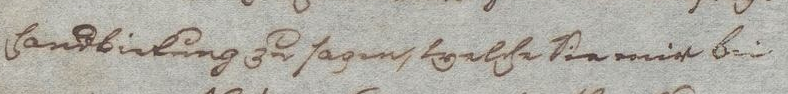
Handbietung zu sagen, welche Sie mir bei
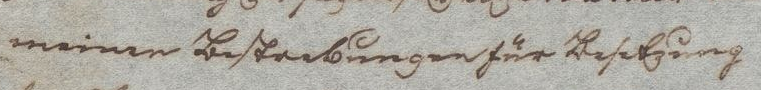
meinen Bestrebungen für Besetzung
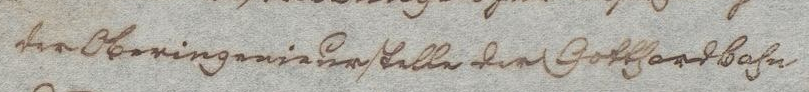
der Oberingenieurstelle der Gotthardbahn
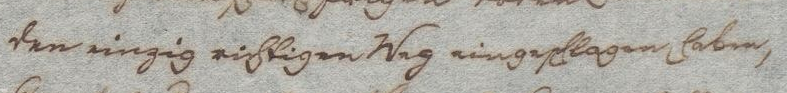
den einzig richtigen Weg eingeschlagen haben,
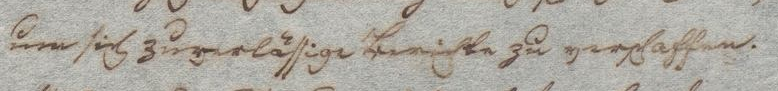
um sich zuverlässige Berichte zu verschaffen.
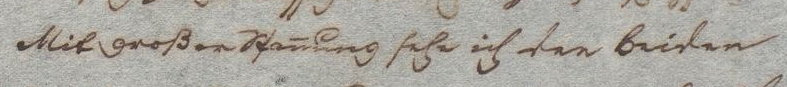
Mit großer Spannung sehe ich den beiden
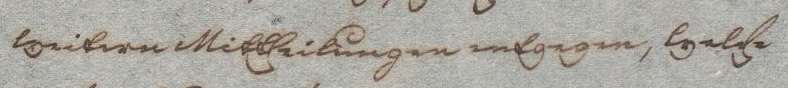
weitern Mittheilungen entgegen, welche
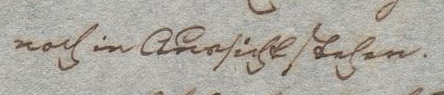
noch in Aussicht stehen.
